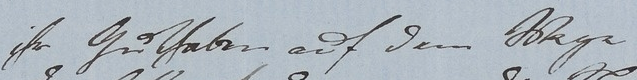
ihr Guthaben auf dem Wege
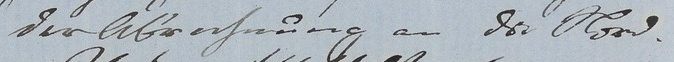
der Abrechnung an die Nord-
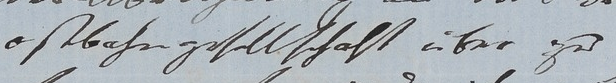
ostbahngesellschaft über zu
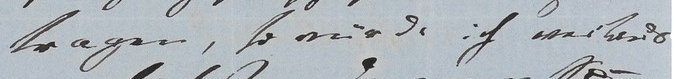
tragen, so würde ich weitaus
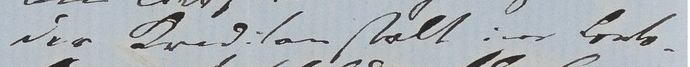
der Kreditanstalt im Conto-
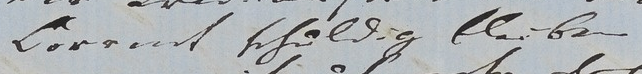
Corrent schuldig bleiben
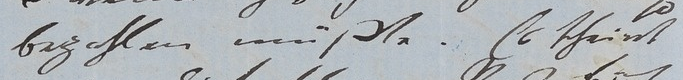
bezahlen müßte. Es scheint
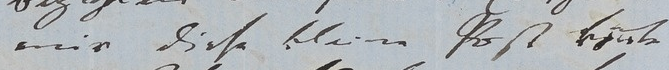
mir diese kleine Post könnte
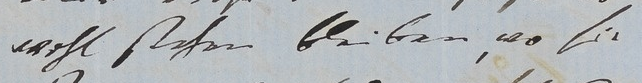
wohl stehen bleiben, wo sie
